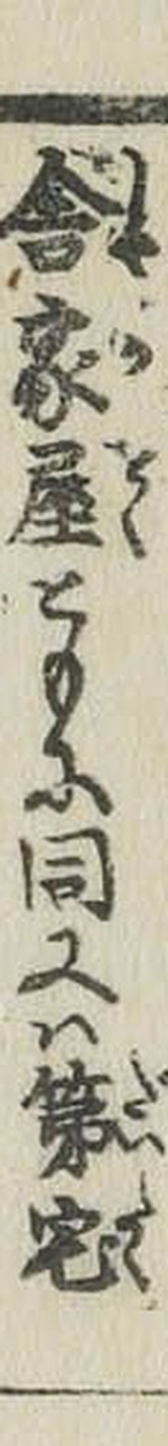舎家屋ともに同又は第宅
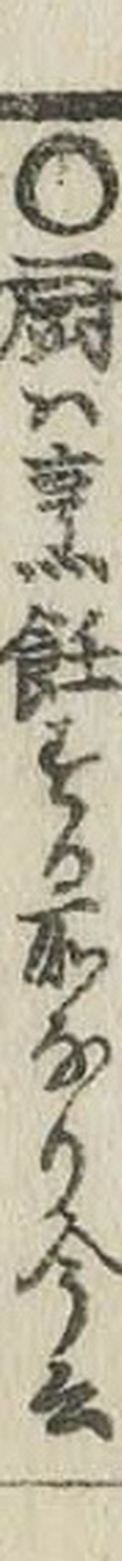○厨は烹飪する所なり今云
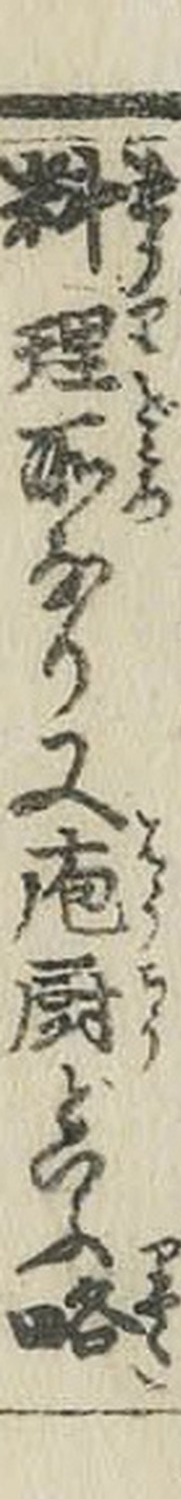料理所なり又庖厨といふ略
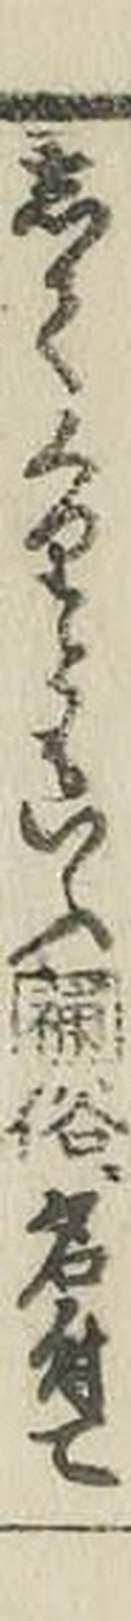してくりともいふ補俗名付て
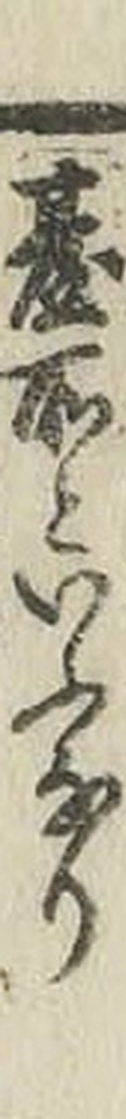台所といふなり
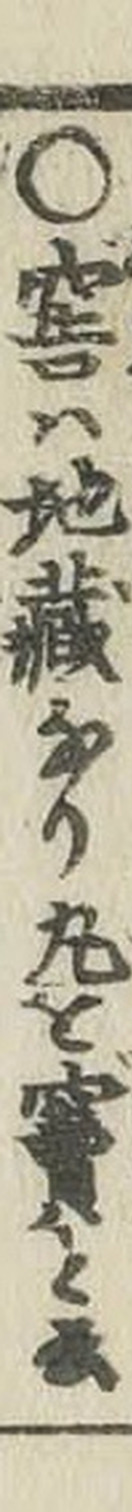○窖は地蔵なり丸を竇と云
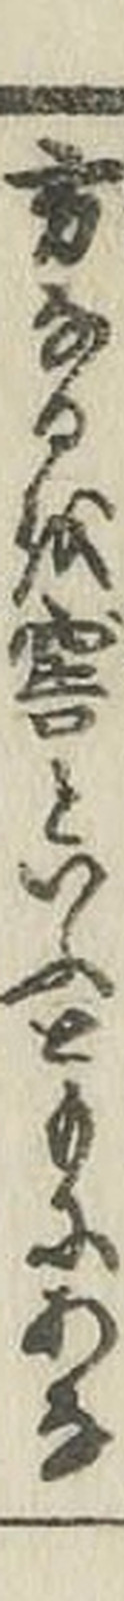方なるを窖といふともにあな
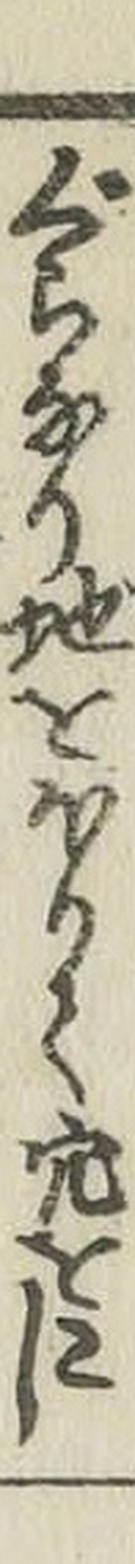ぐらなり地をほりて穴をこし
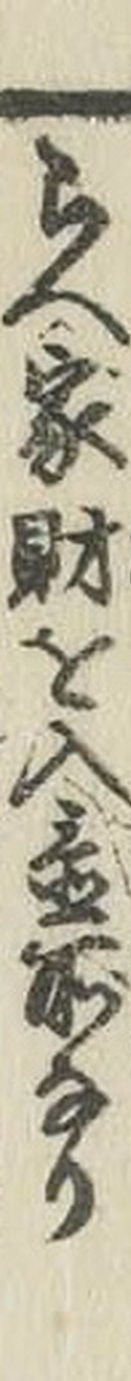らへ家財を入置所なり
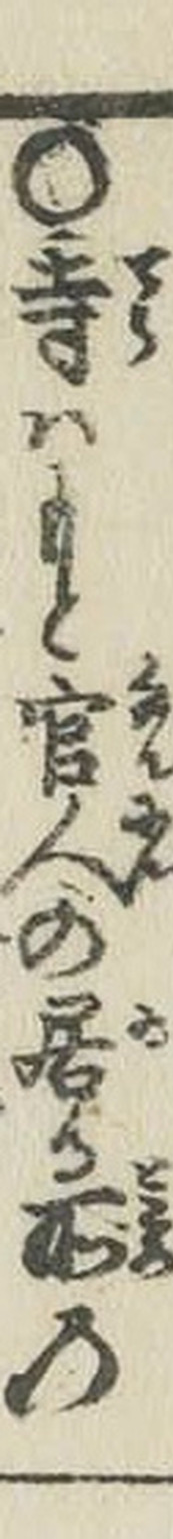○寺はもと官人の居る所の
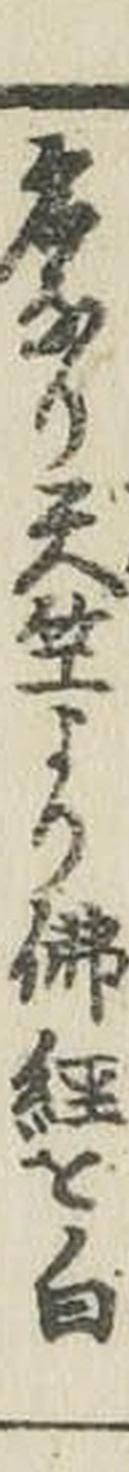名なり天竺より仏経を白
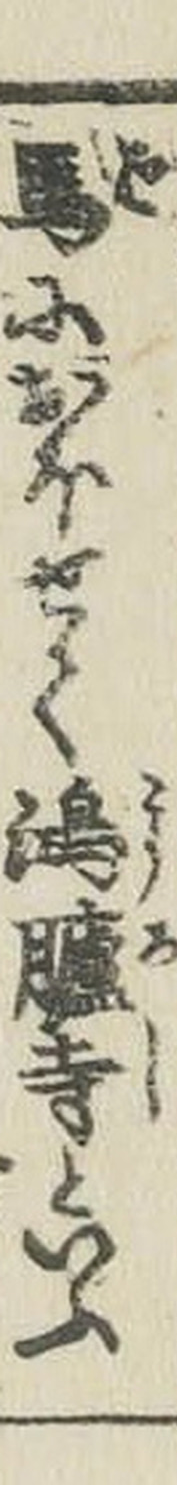馬におほせて鴻臚寺といふ
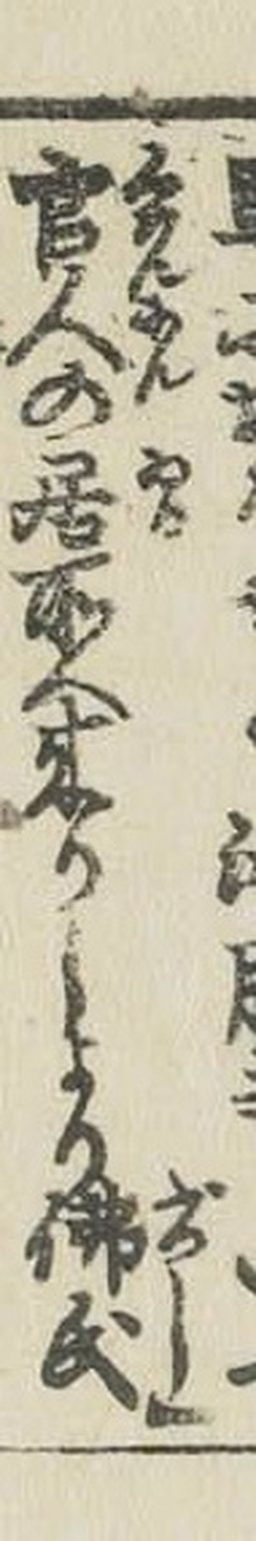官人の居所へ来りしより仏氏
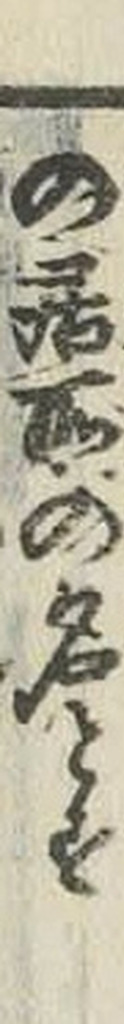の居所の名とす
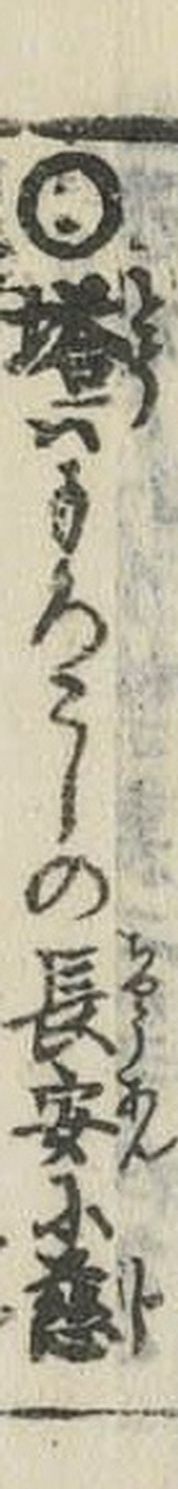○塔はもろこしの長安に慈
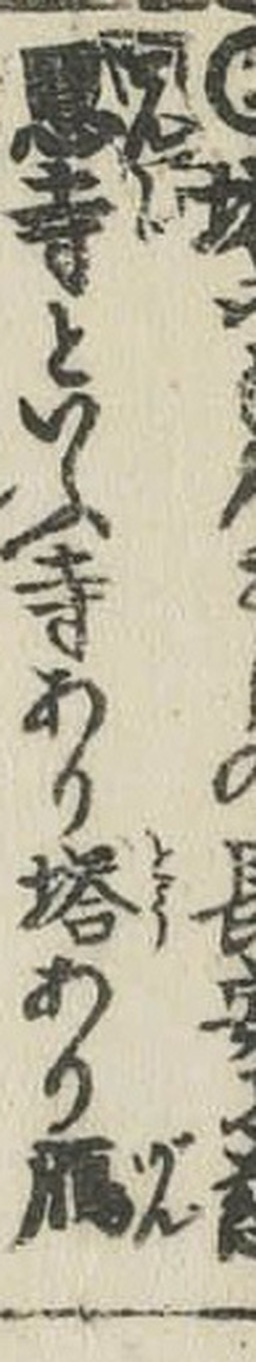恩寺といふ寺あり塔あり鴈
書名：増補頭書訓蒙図彙大成 10巻 2:巻之1-3
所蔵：東京学芸大学教育コンテンツアーカイブ
